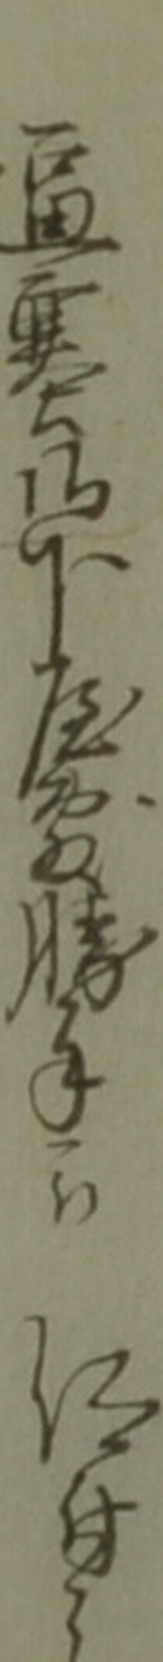逼塞御下屋敷勝手被仰付之
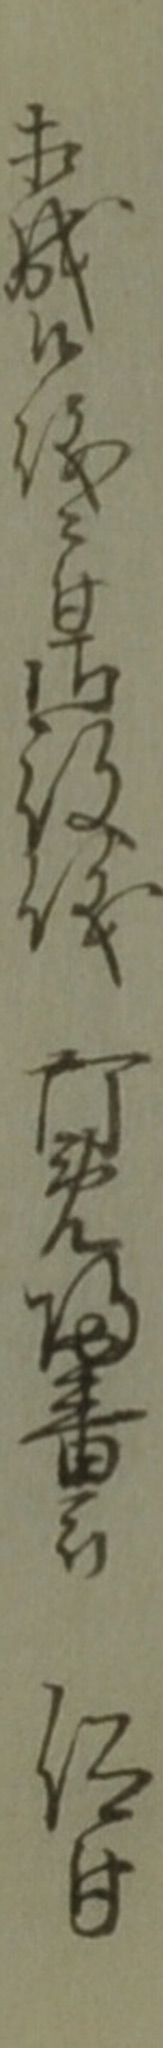相成候儀ニ付御役儀御免帰番被仰付
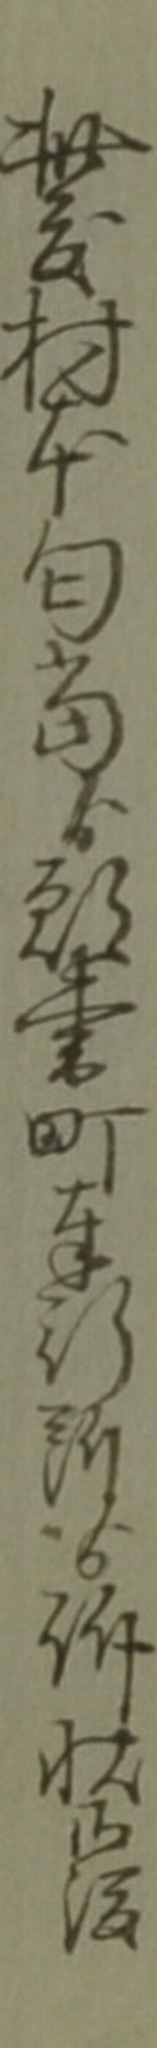此度村本勾当ゟ願書町奉行所ゟ訴状御渡
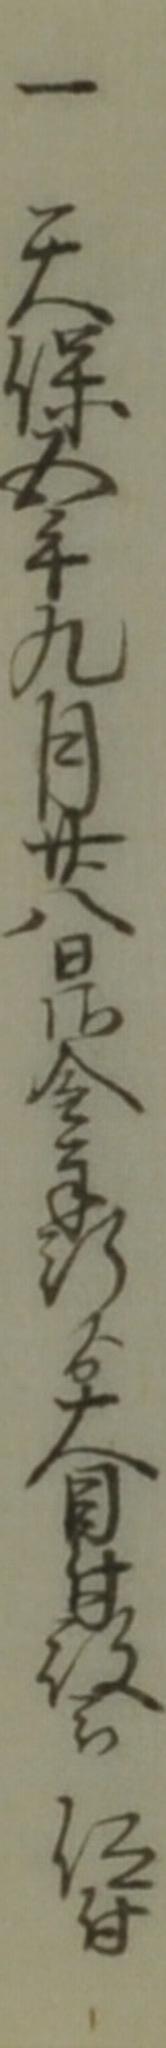一天保五午九月廿八日御金奉行ゟ大目付役被仰付
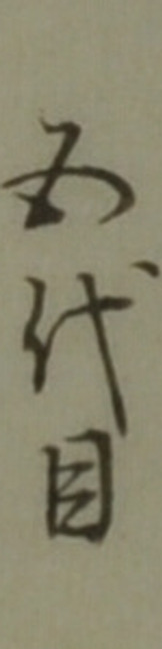五代目
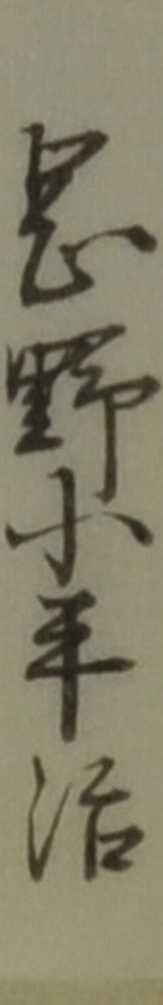岡野小平治
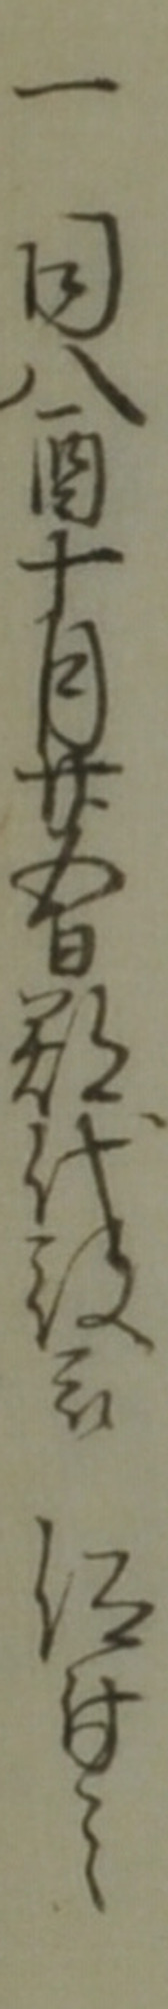一同八酉十月廿五日郡代役被仰付之
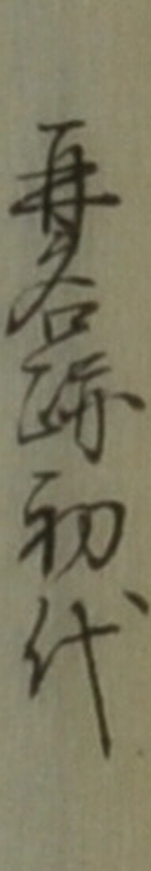再名跡初代
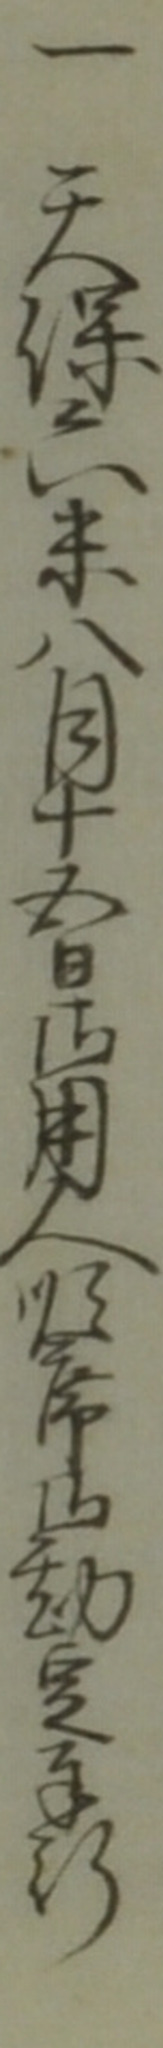一天保六未八月十五日御用人順席御勘定奉行
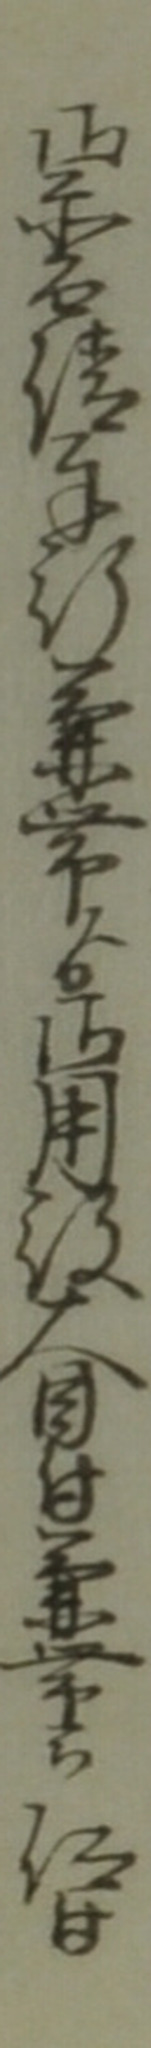御普請奉行兼帯ゟ御用役大目付兼帯被仰付
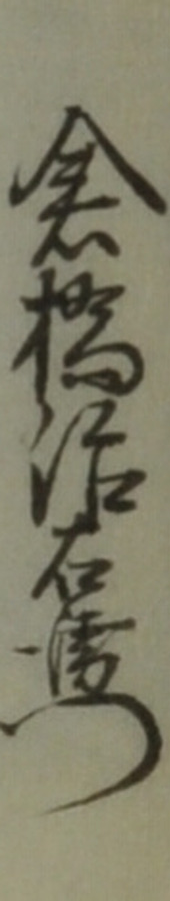倉橋治右衛門
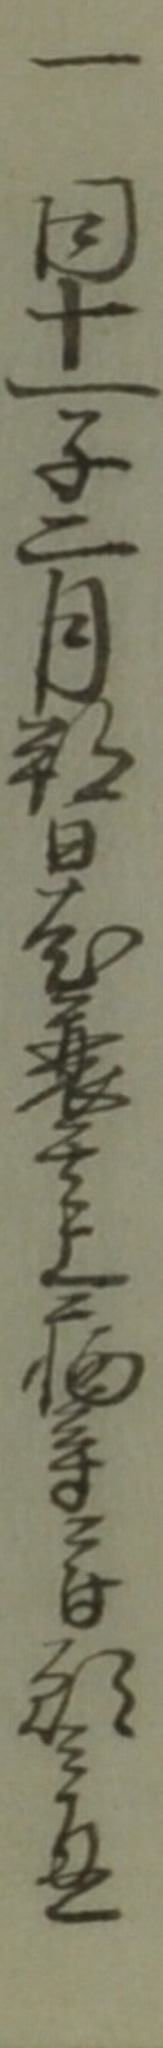一同十一子二月朔日老衰其上病気ニ付願之通
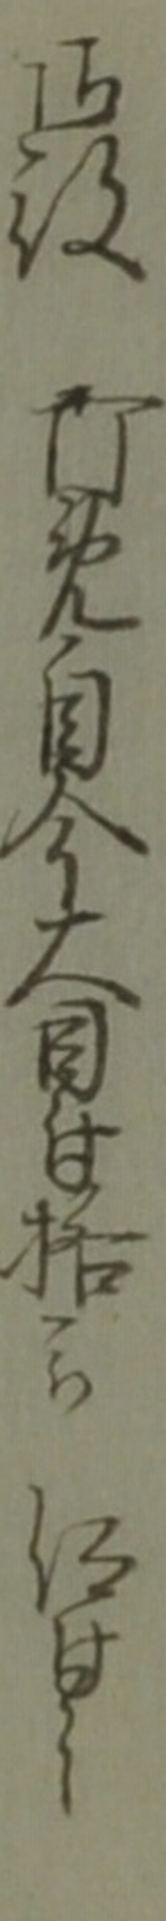御役御免自今大目付格被仰付之
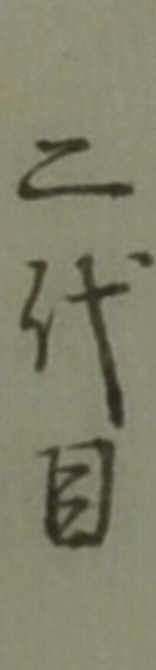二代目
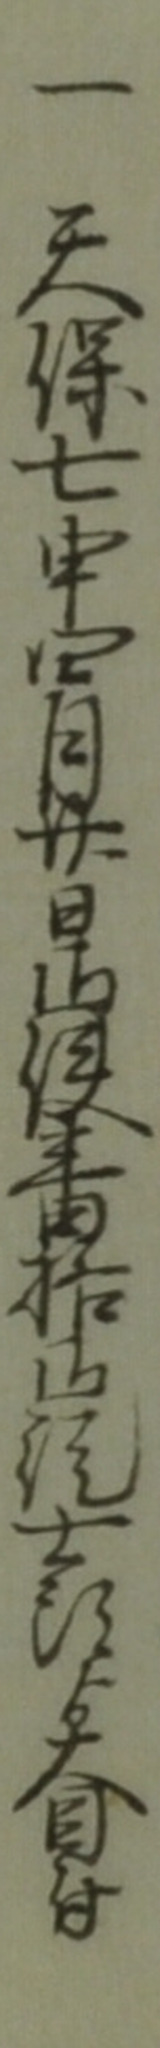一天保七申四月廿日御使番格御徒士頭ゟ大目付
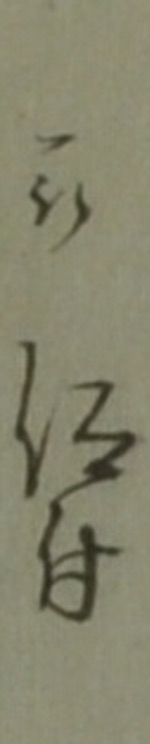被仰付
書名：諸御役代々録（三）
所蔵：伊那市立高遠町図書館・合同会社AMANE
